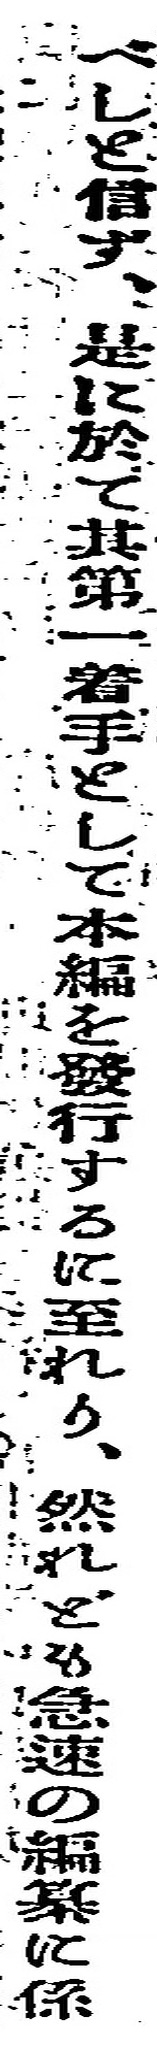べしと信ず、是に於て其第一着手として本編を発行するに至れり、然れども急速の編纂に係
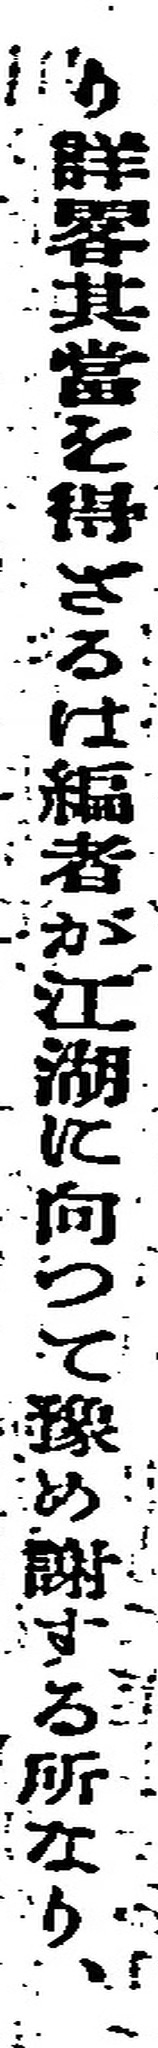り詳略其当を得ざるは編者が江湖に向つて予め謝する所なり、
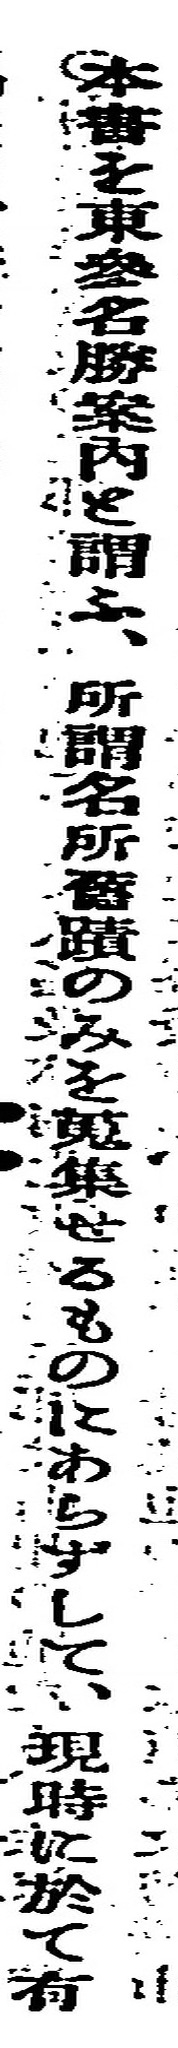本書を東参名勝案内と謂ふ、所謂名所旧蹟のみを蒐集せるものにあらずして、現時に於て有
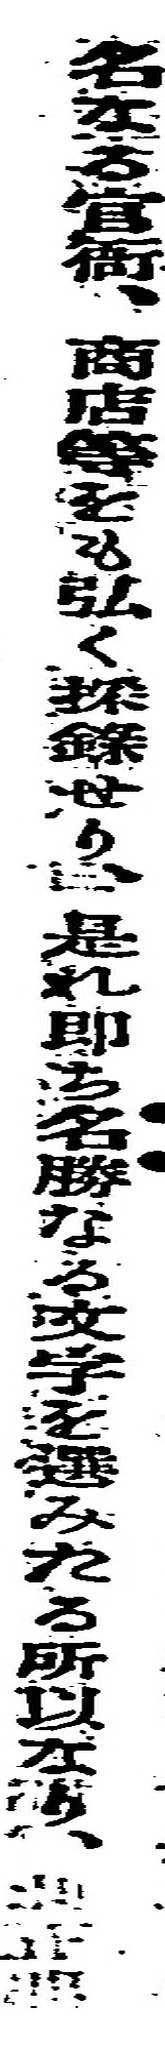名なる官衙、商店等をも弘く採録せり、是れ即ち名勝なる文字を選みたる所以なり、

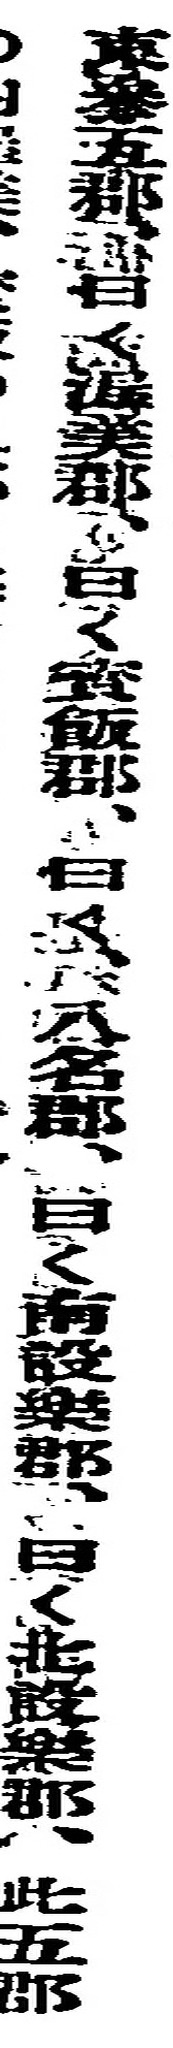東参五郡、曰く渥美郡、曰く宝飯郡、曰く、八名郡、曰く南設楽郡、曰く北設楽郡、此五郡
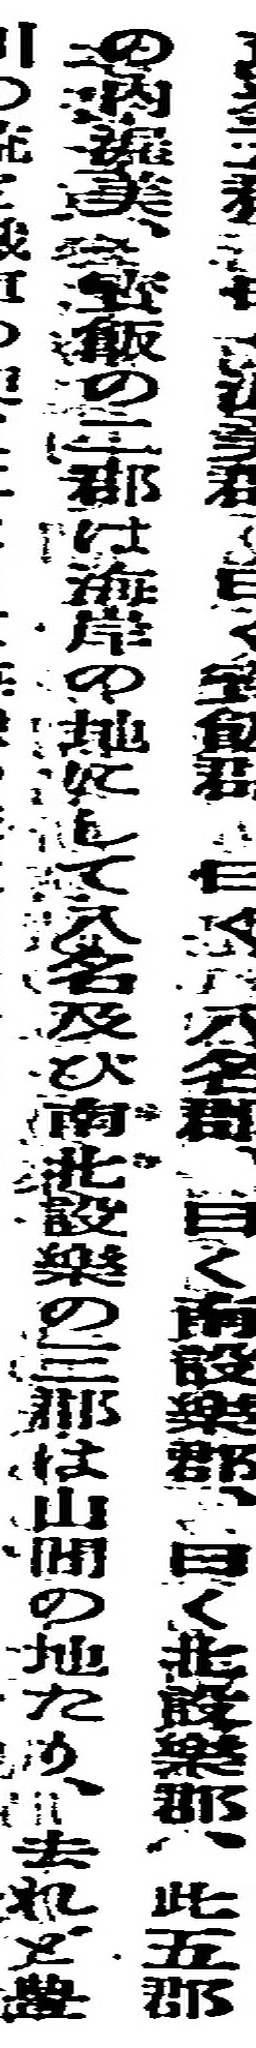の内渥美、宝飯の二郡は海岸の地にして八名及び南北設楽の三郡は山間の地たり、去れど豊
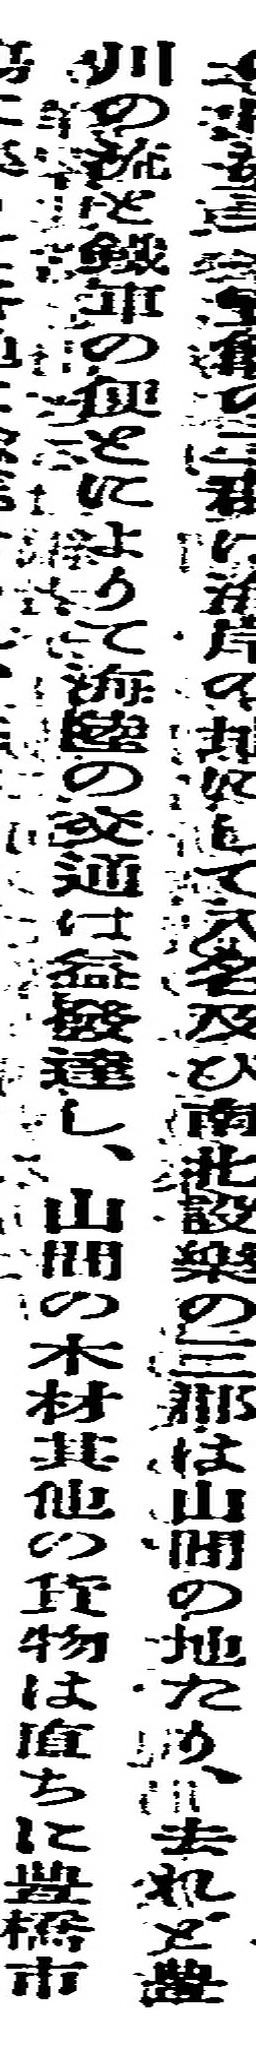川の流と鉄車の便とによりて海陸の交通は益発達し、山間の木材其他の貨物は直ちに豊橋市
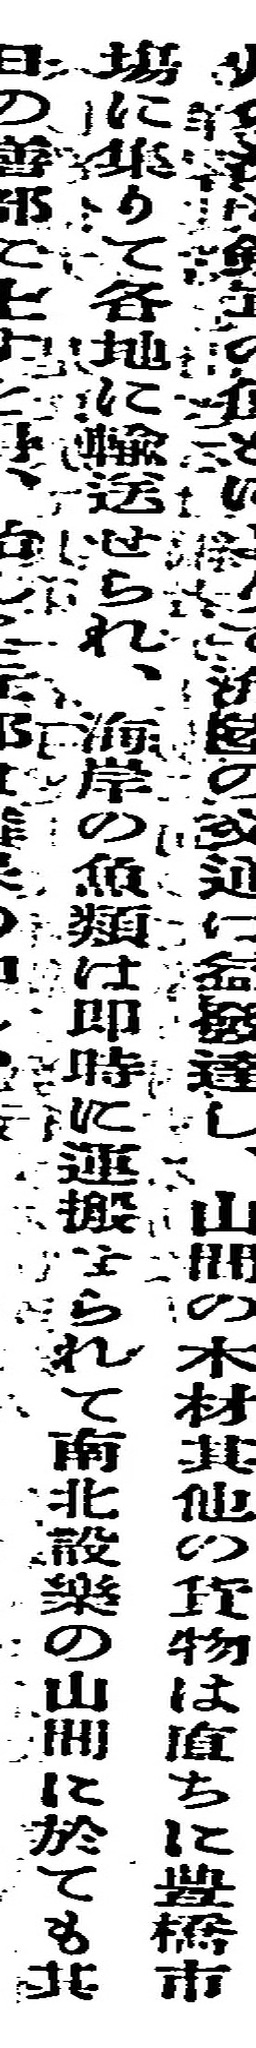場に集りて各地に輸送せられ、海岸の魚類は即時に運搬せられて南北設楽の山間に於ても其
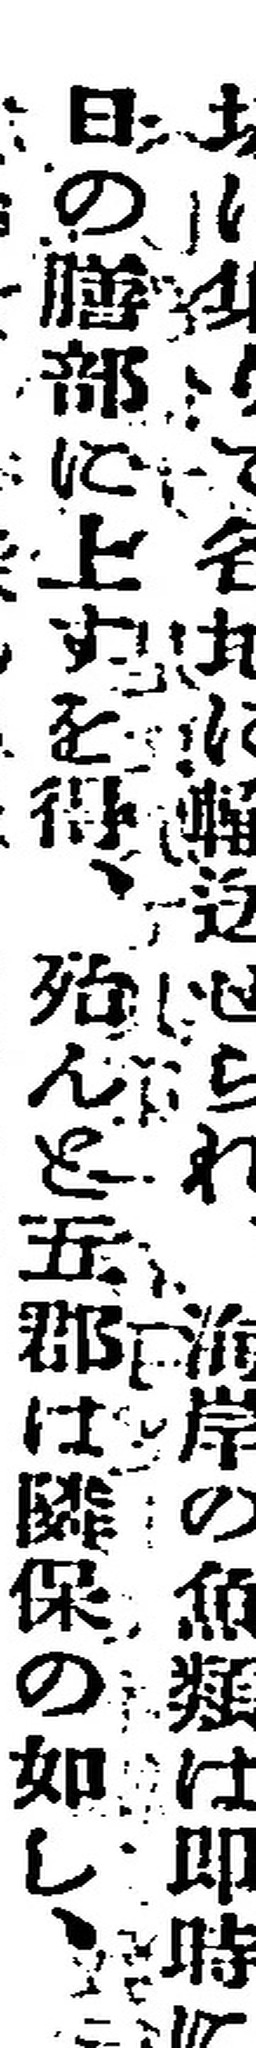日の膳部に上すを得、殆んと五郡は隣保の如し、
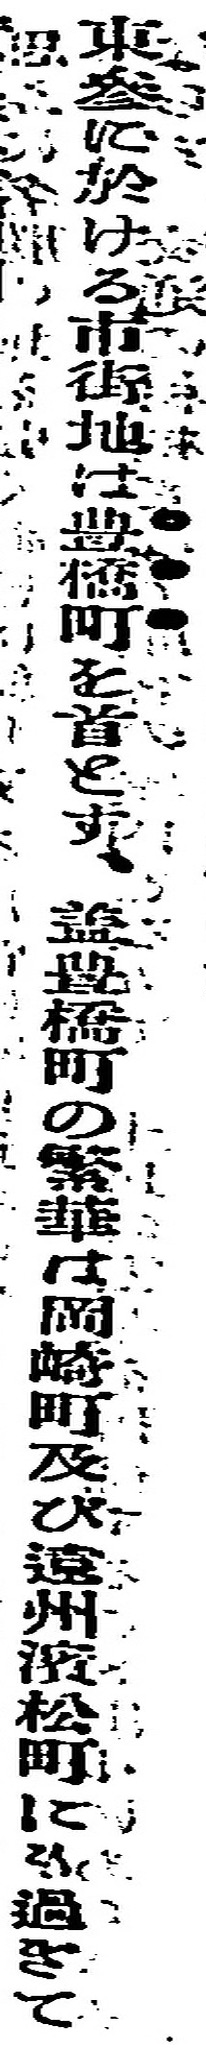東参に於ける市街地は豊橋町を首とす、蓋豊橋町の繁華は岡崎町及び遠州浜松町にも過ぎて
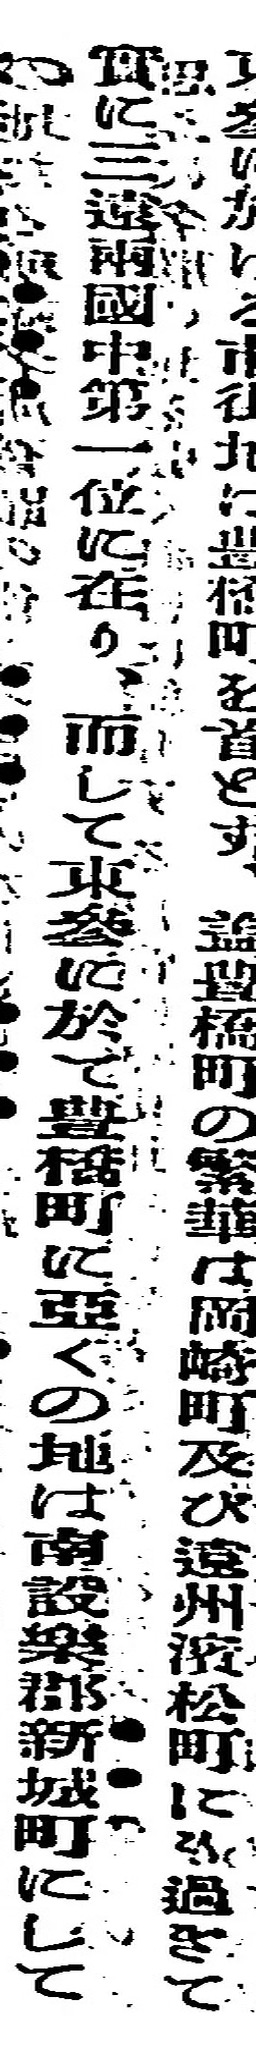実に三遠両国中第一位に在り、而して東参に於て豊橋町に亜くの地は南設楽郡新城町にして
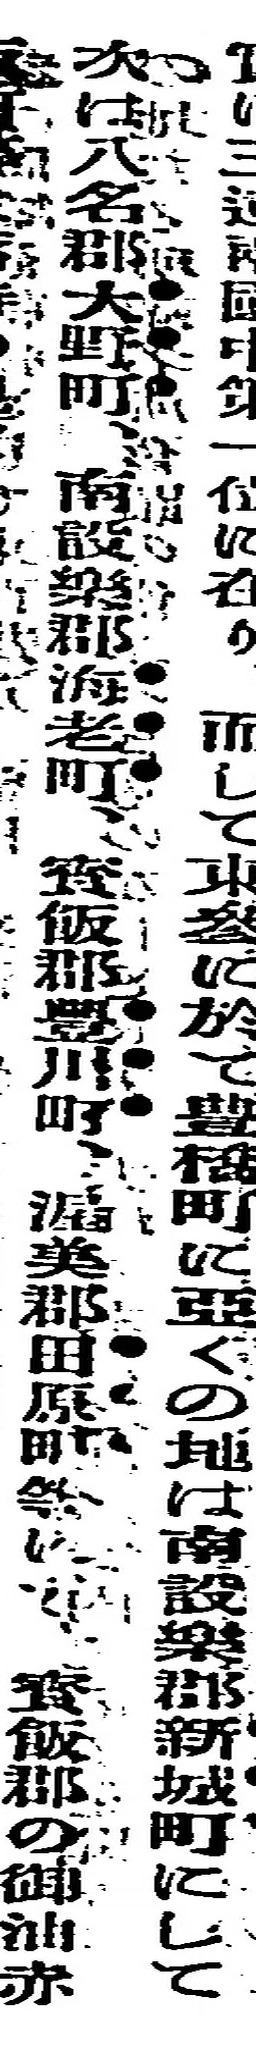次は八名郡大野町、南設楽郡海老町、宝飯郡豊川町、渥美郡田原町等にて、宝飯郡の御油赤
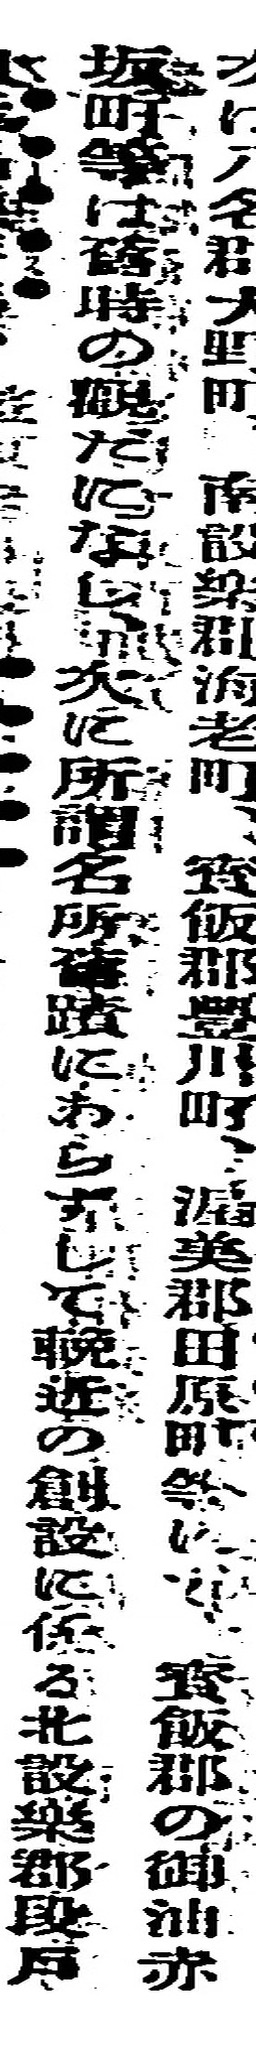坂町等は旧時の観だになし、次に所謂名所旧蹟にあらずして輓近の創設に係る北設楽郡段戸
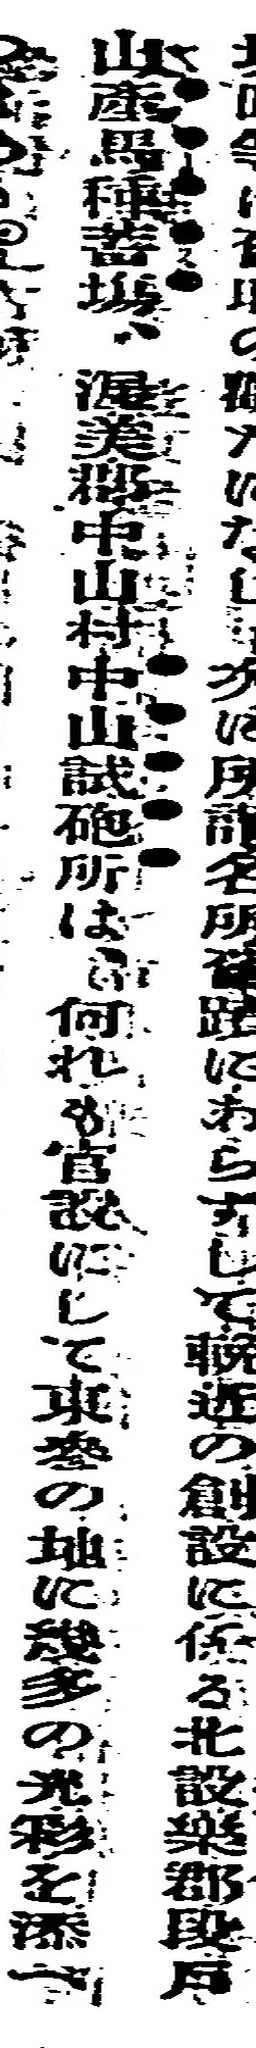山産馬種蓄場、渥美郡中山村中山試砲所は、何れも官設にして東参の地に幾多の光彩を添へ
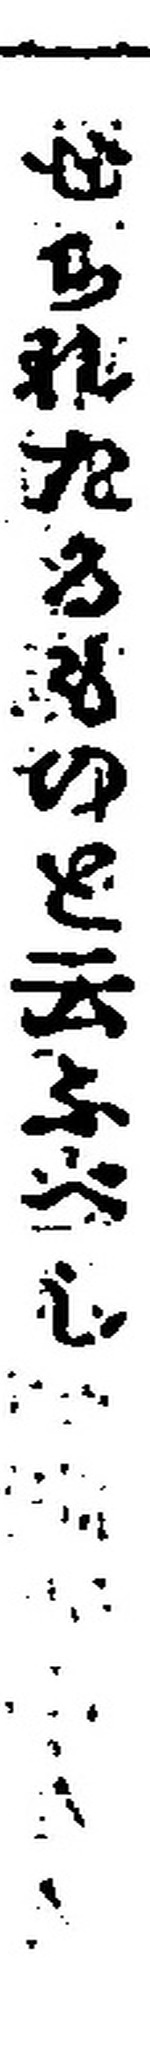せられたるものと云ふべし
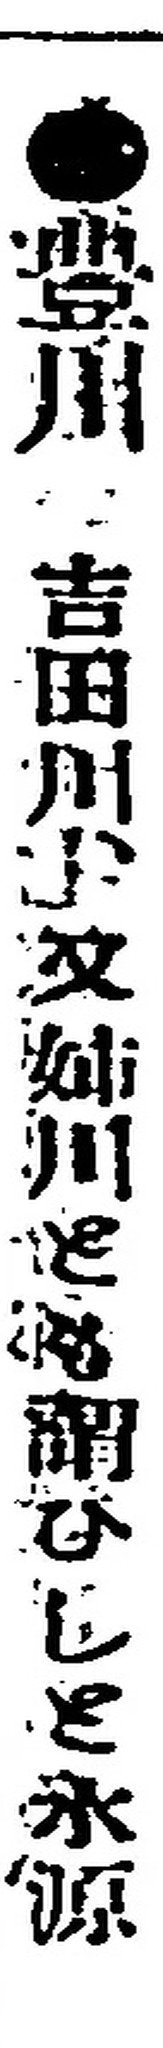●豊川吉田川、又姉川とも謂ひしと水源
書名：東参名勝案内
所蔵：国立国会図書館 National Diet Library, JAPAN
